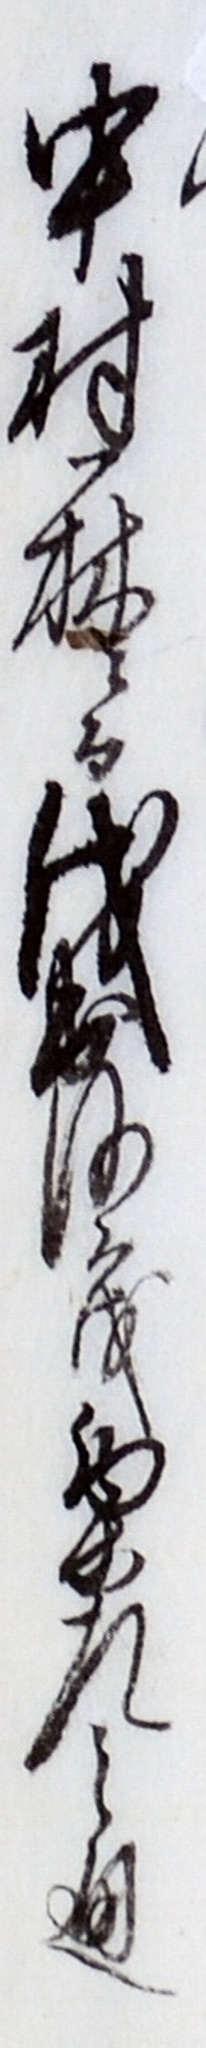中村御林ニ而伐出何も栗左之通
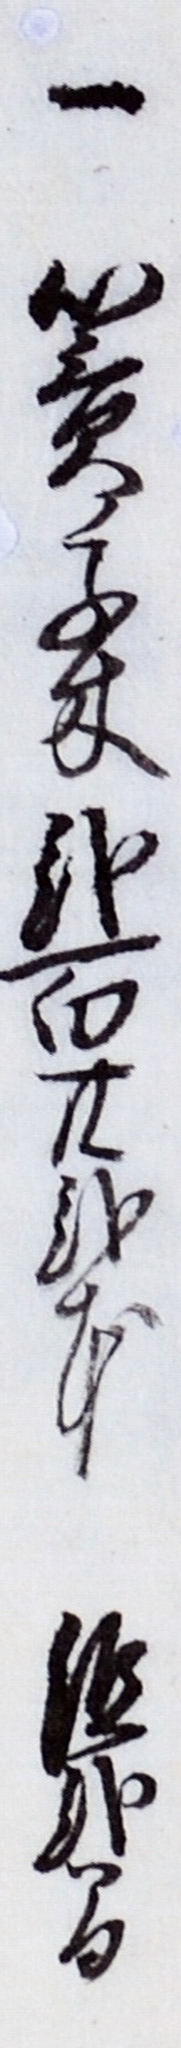一簀ノ子木弐百廿弐本但弐間
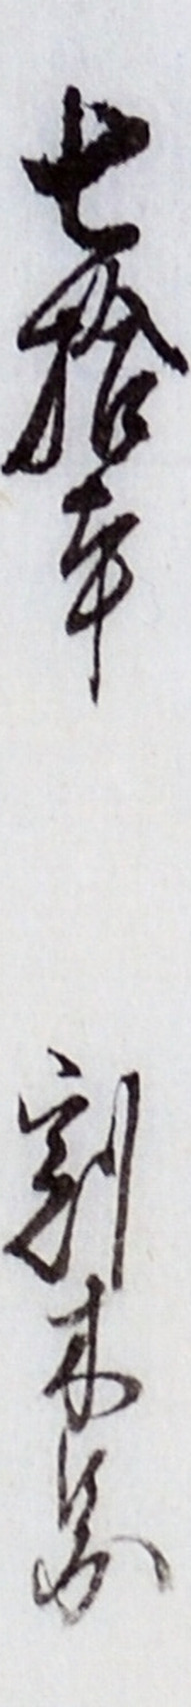七拾本割木図
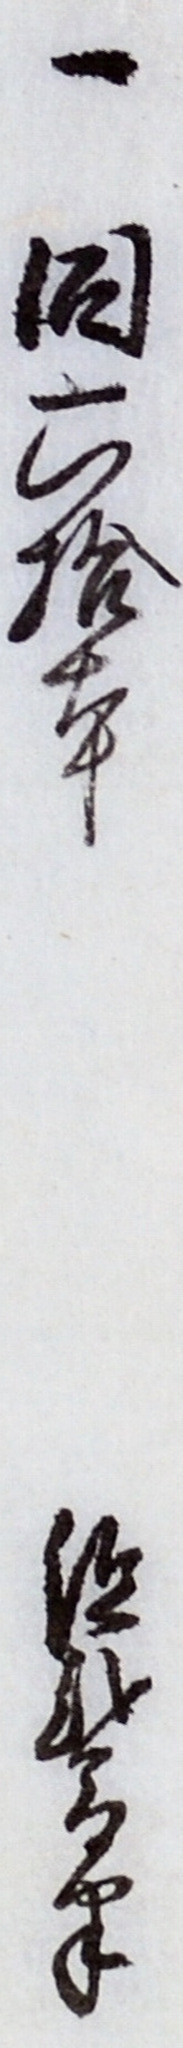一同六拾本但弐間半
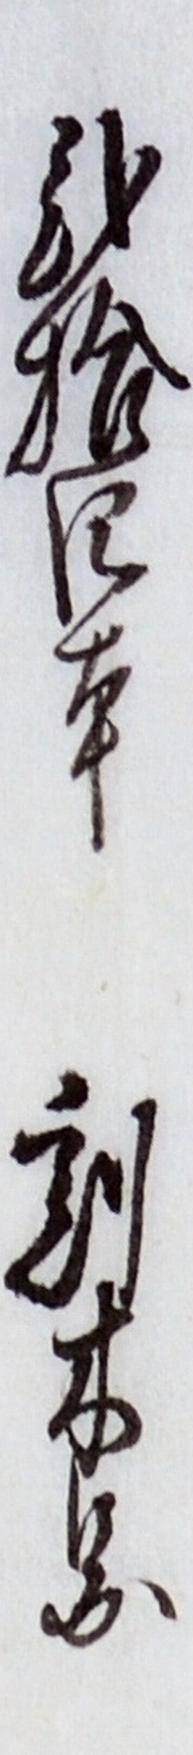弐拾四本割木図
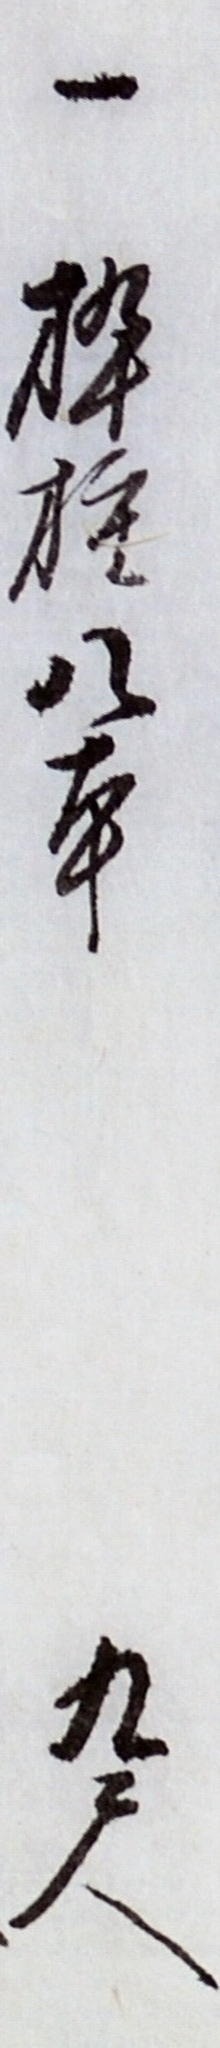一枠柱八本九尺
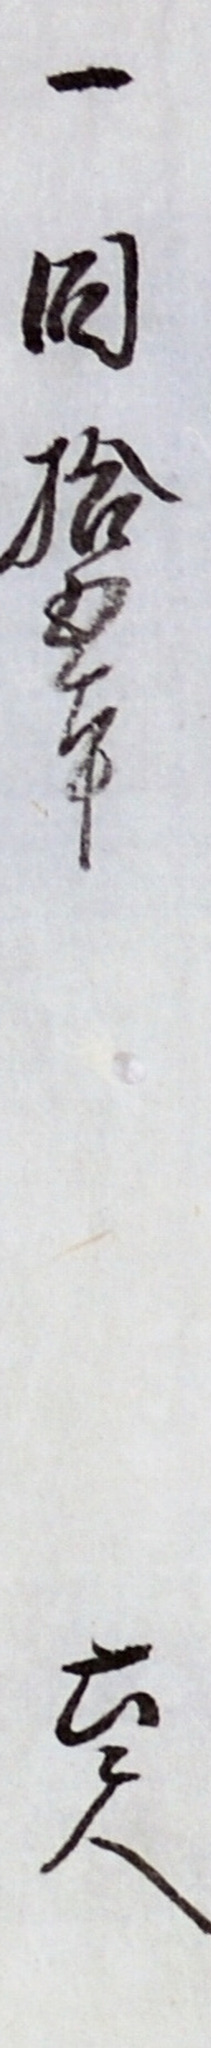一同拾五本六尺
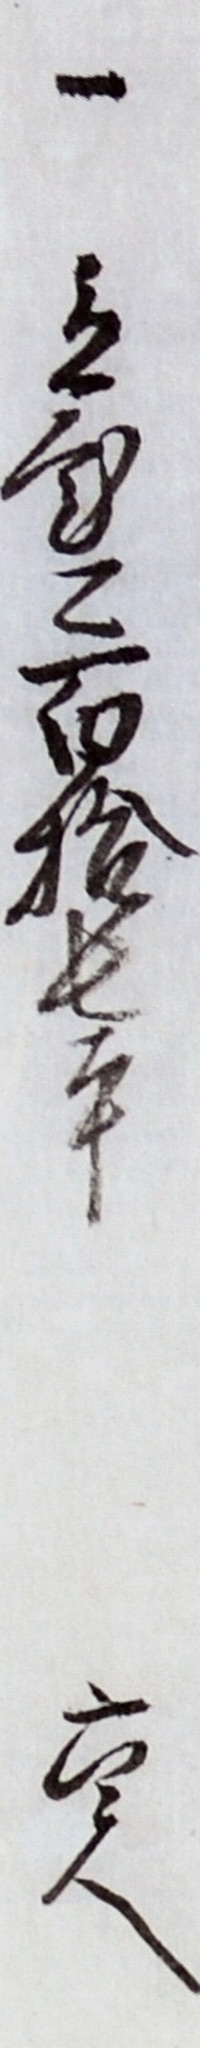一立ひこ百拾七本六尺

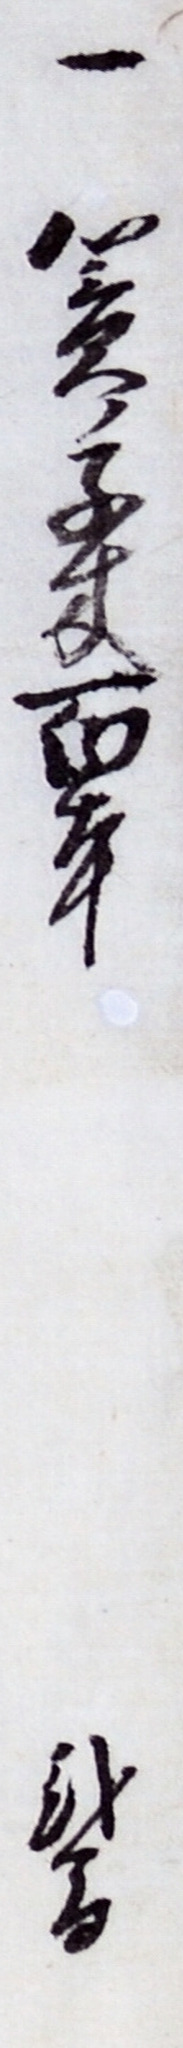一簀ノ子木百本弐間
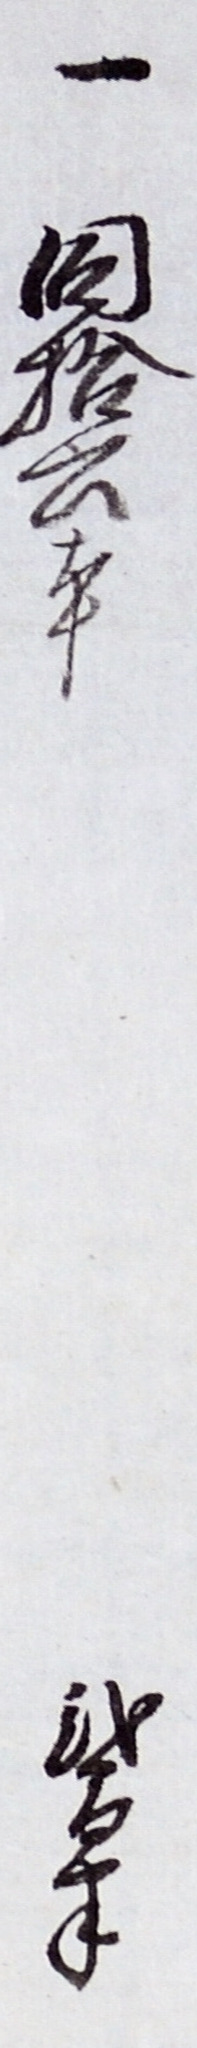一同拾六本弐間半
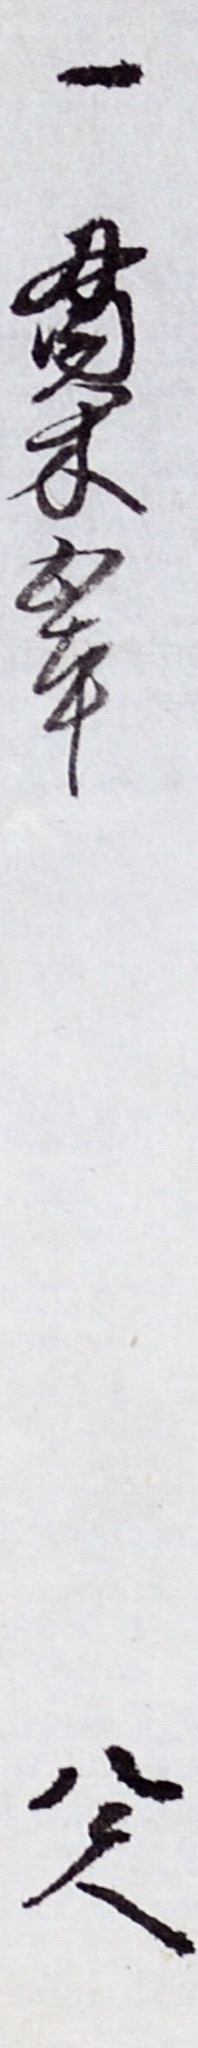一貫木五本八尺
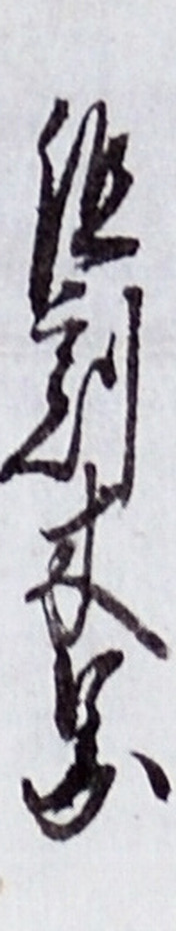但割木図
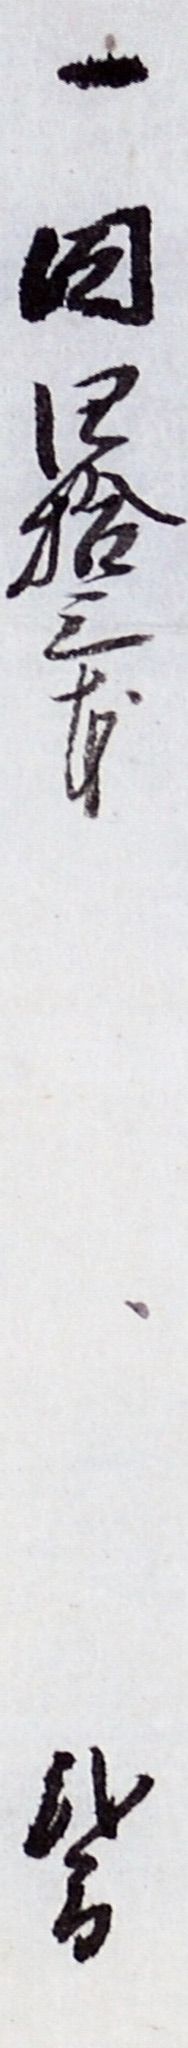一同四拾三本弐間
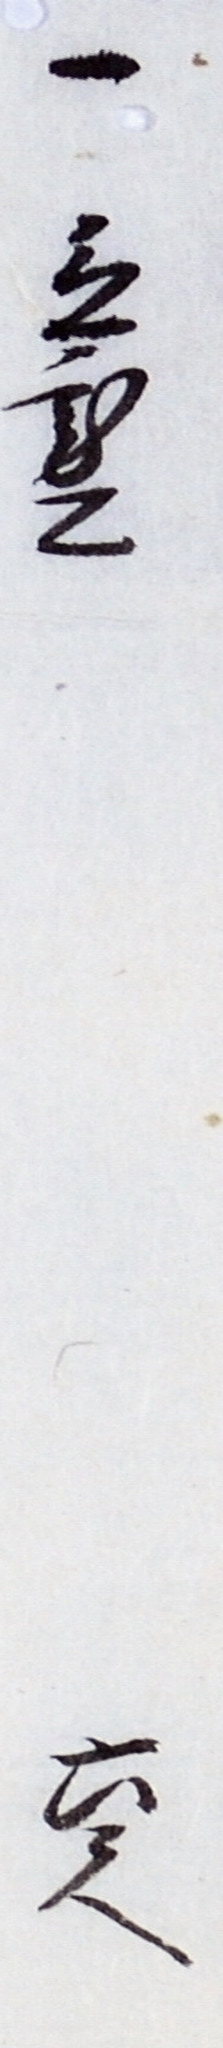一立ひこ六尺
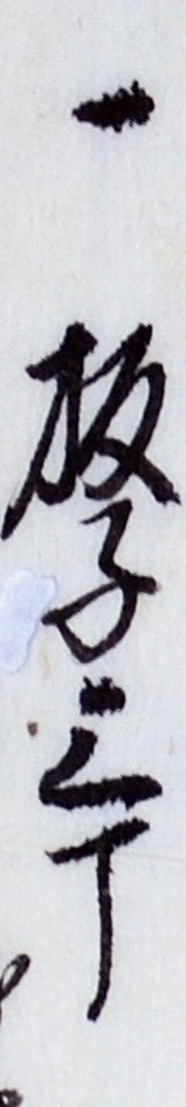一板子三丁
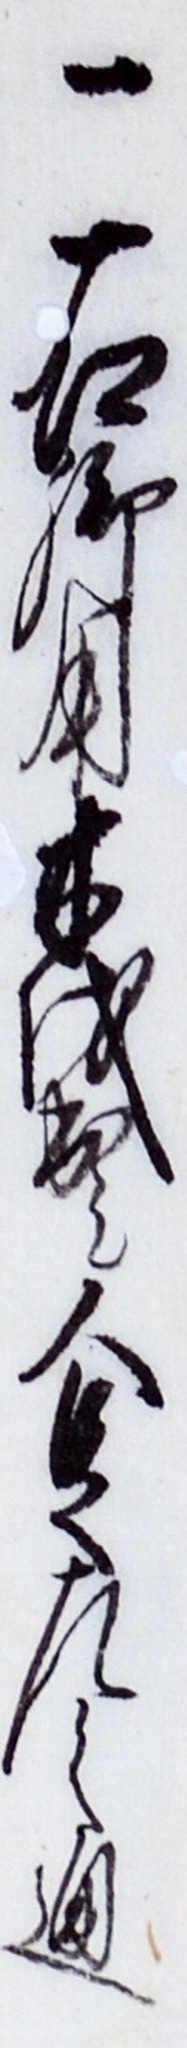一右御用木伐出シ人足左之通
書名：御山奉行御用控
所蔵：伊那市立高遠町図書館・合同会社AMANE
